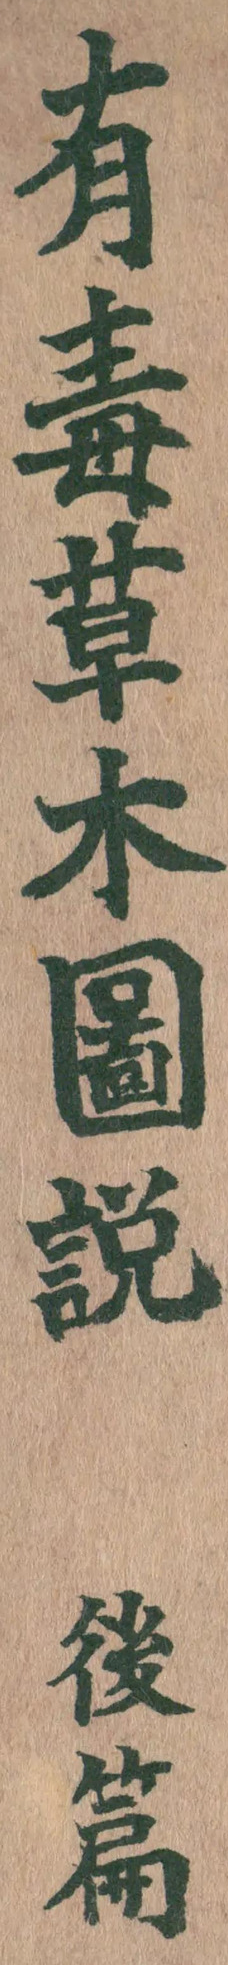有毒草木図説後編

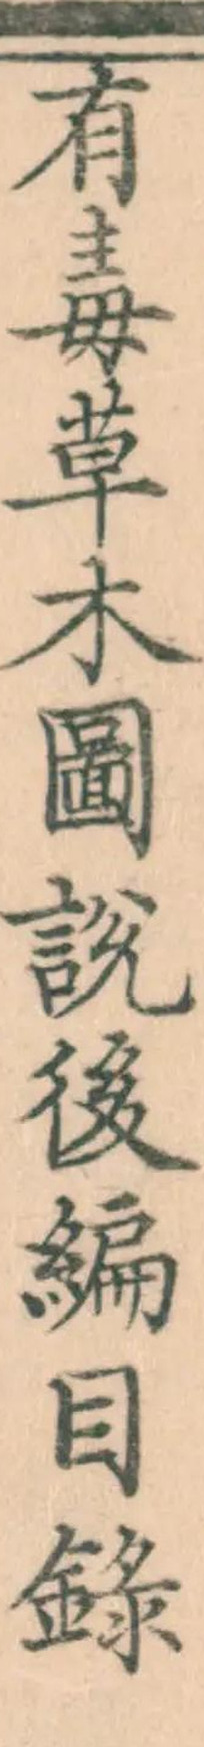有毒草木図説後編目録
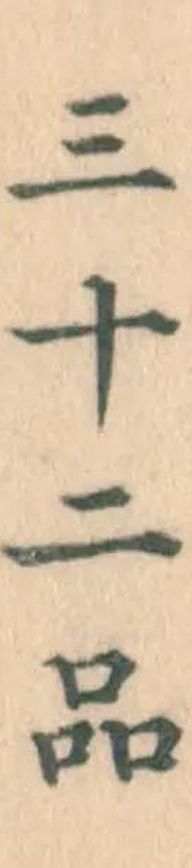三十二品

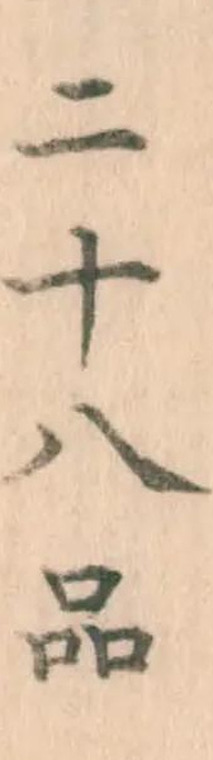二十八品
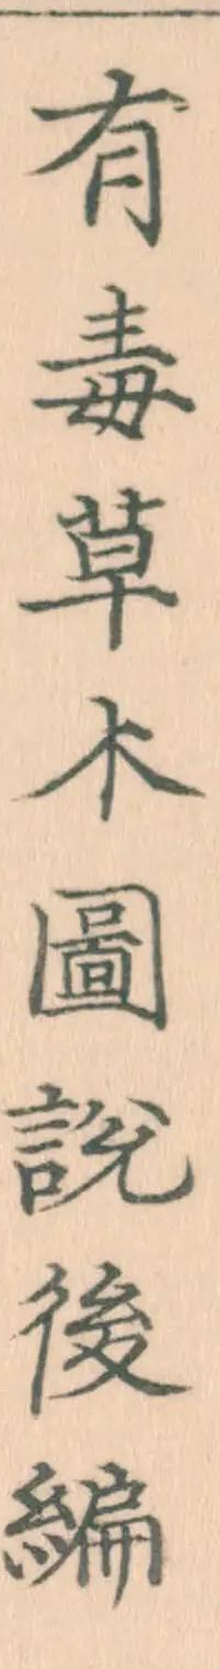有毒草木図説後編
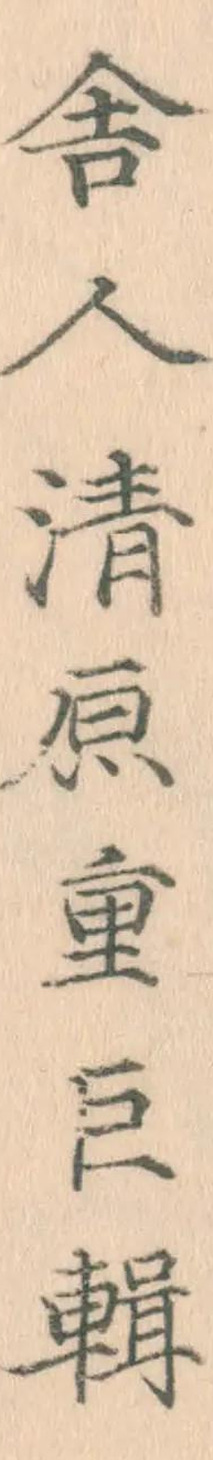舎人清原重巨輯
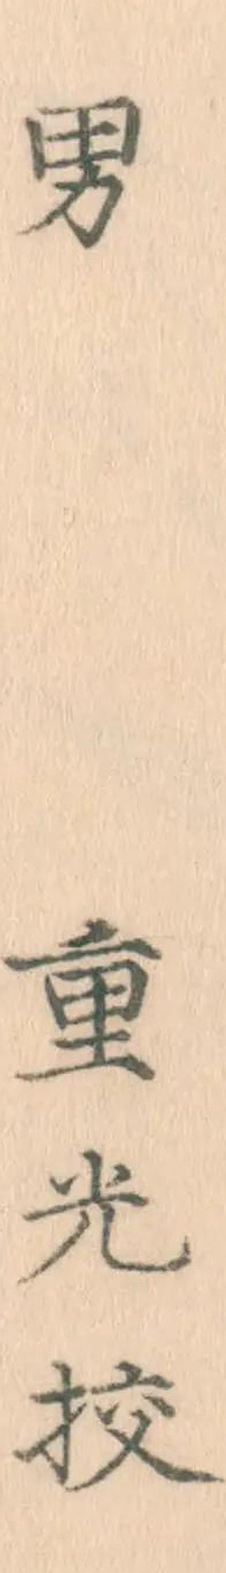男重光挍

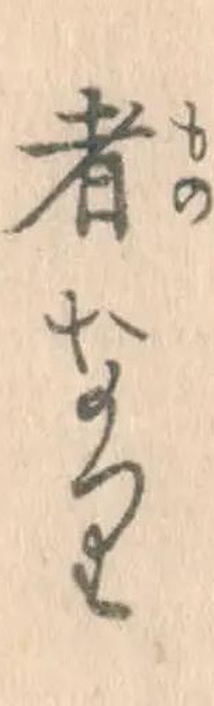者なり

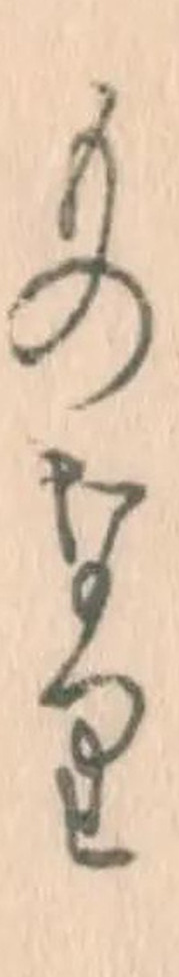ものなり

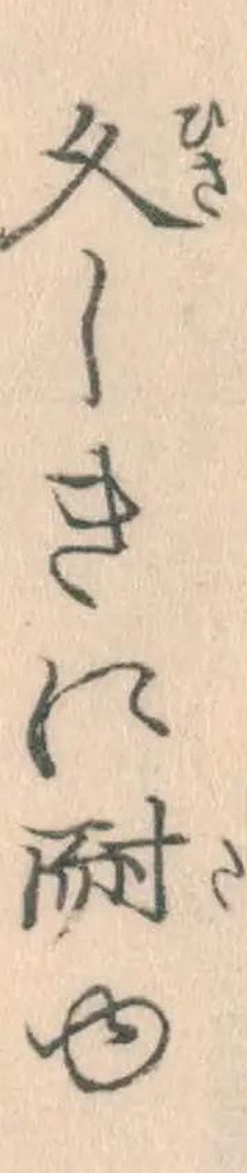久しきに耐ゆ

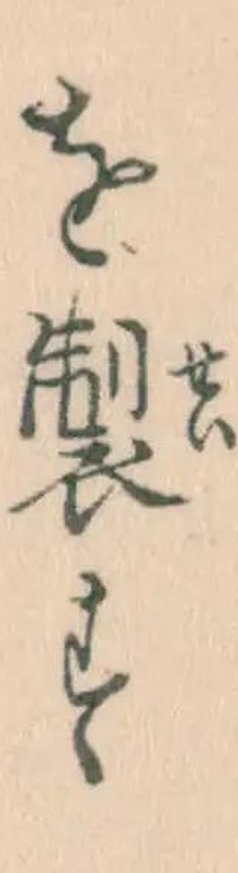を製す

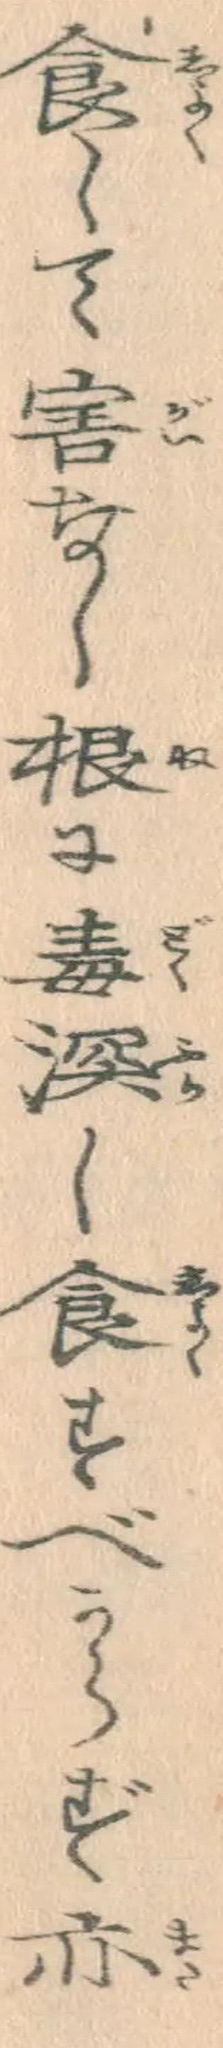食して害なし根に毒深し食すべからず亦

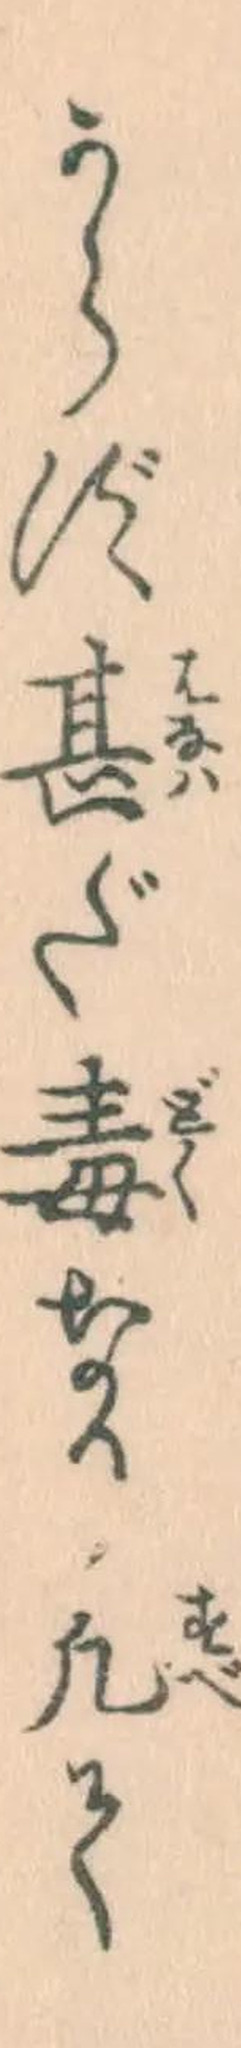からず甚だ毒なり凡て

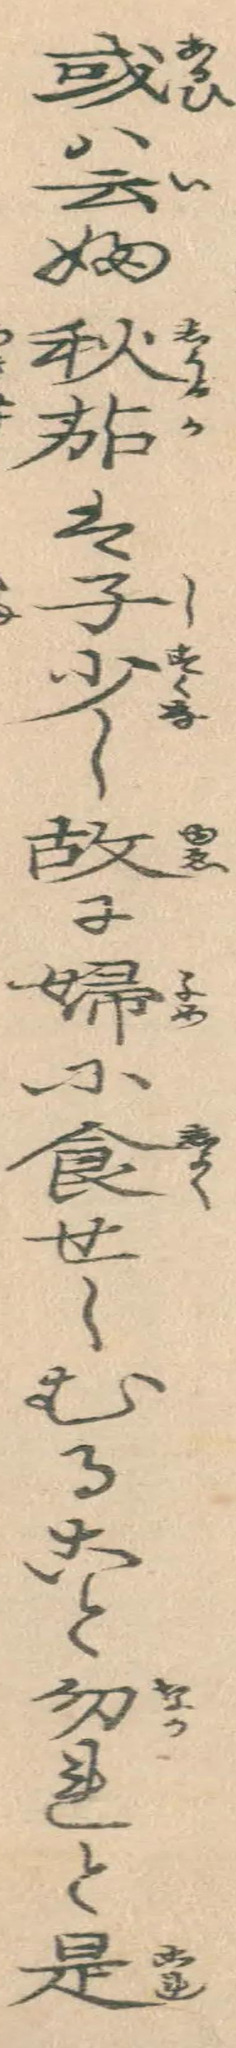或は云ふ秋茄は子少し故に婦に食せしむること勿れと是

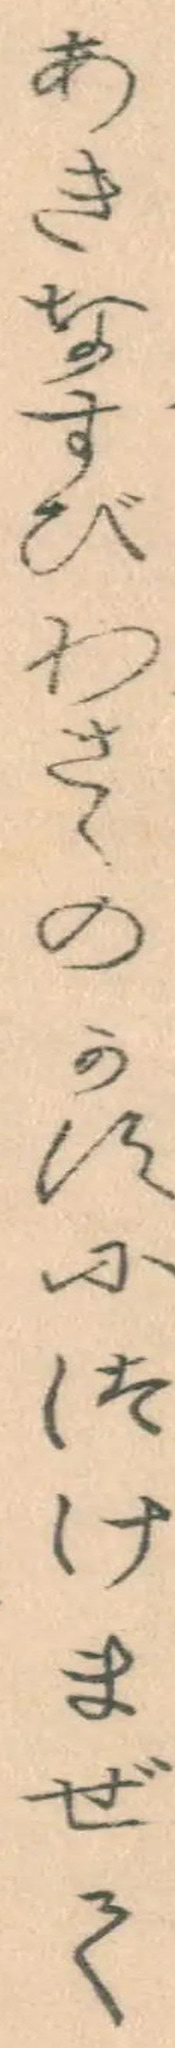あきなすびわささのかすにつけまぜて
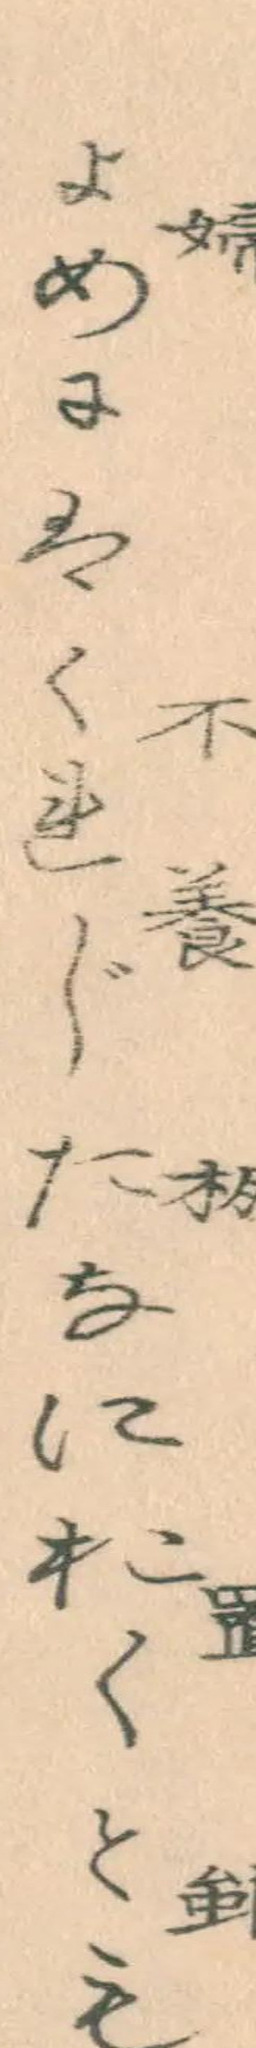よめにはくれじたなにおくとも
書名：有毒草木図説 2巻. [2]
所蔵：国立国会図書館 National Diet Library, JAPAN
